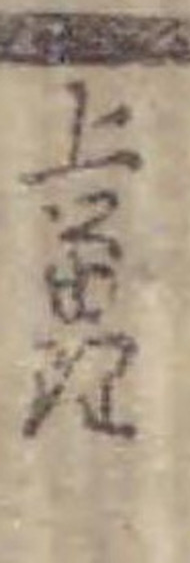上留理
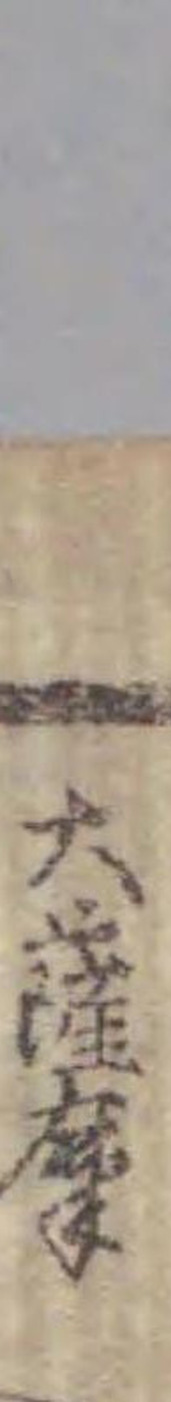大薩摩
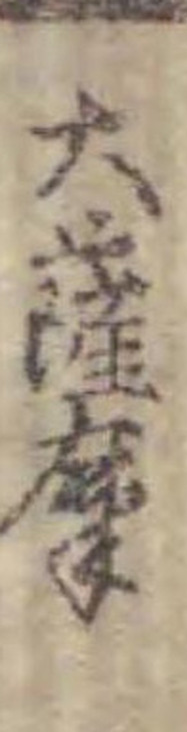大薩摩
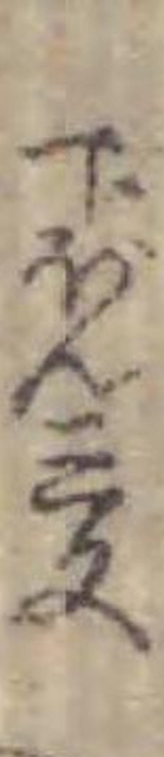下ぼん三又
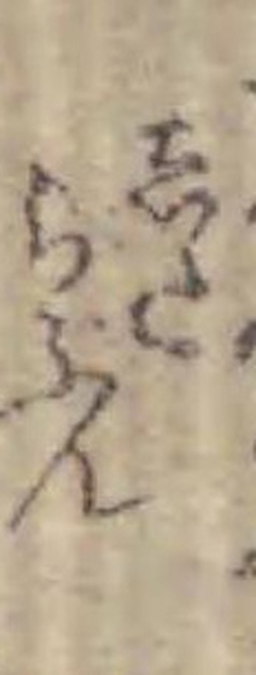らふん
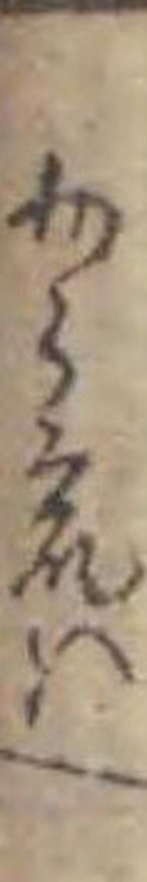わら衆は
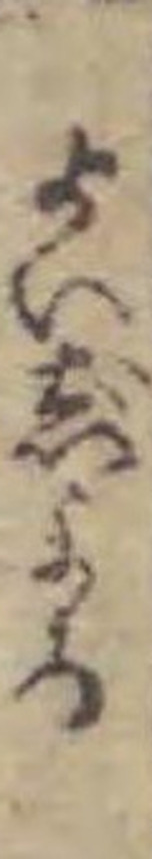よいじよろ
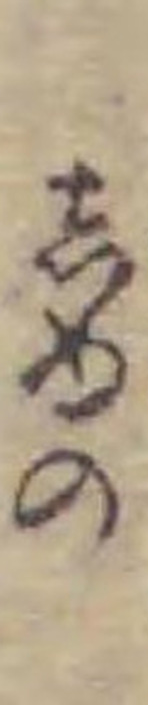しゆの
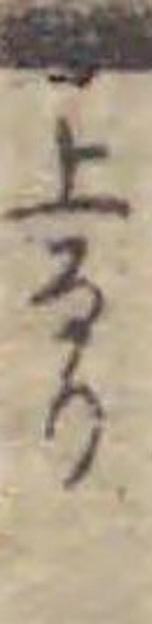上るり
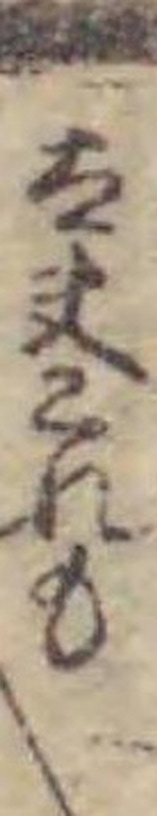太夫これも
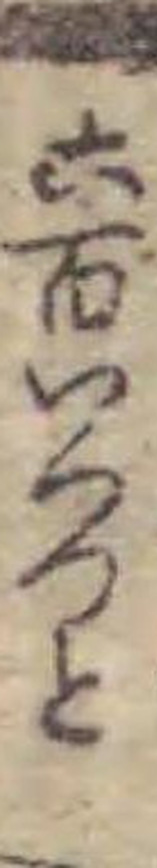六百いくつと
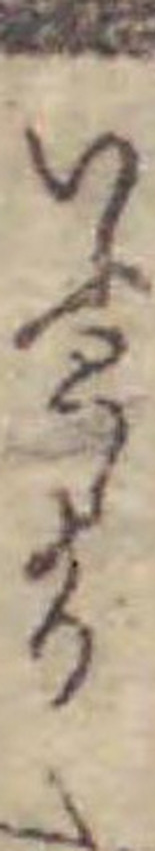いふとしより
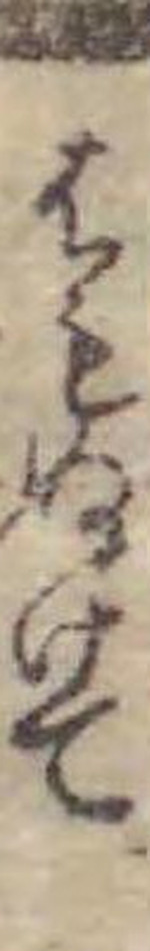はもぬけて
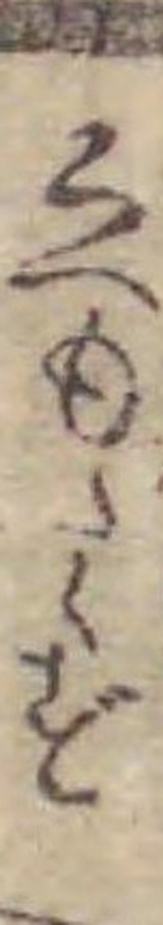くへもたゝず
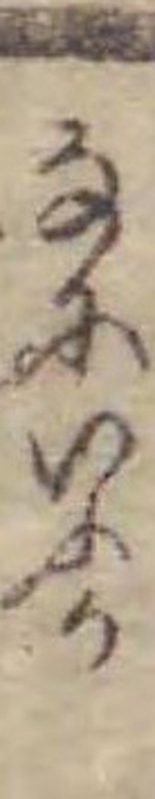なにいふか
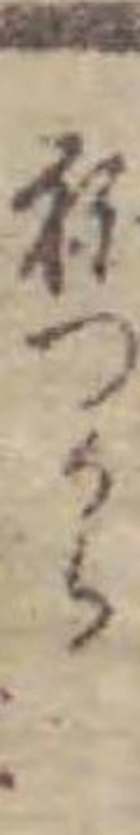ねつから
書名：年寄之冷水曽我 : 3巻
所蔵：国立国会図書館 National Diet Library, JAPAN
